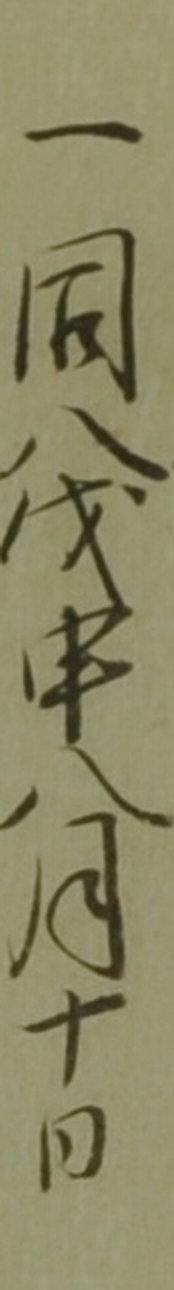一同八戊申八月十日
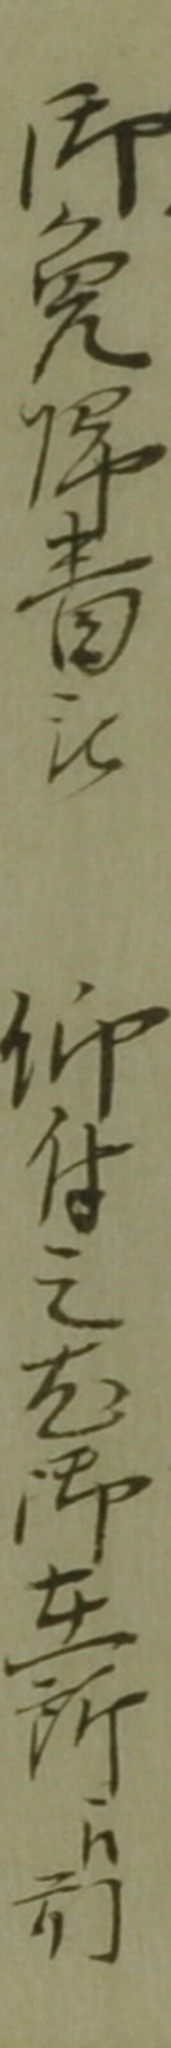御免帰番被仰付之尤御在所江引
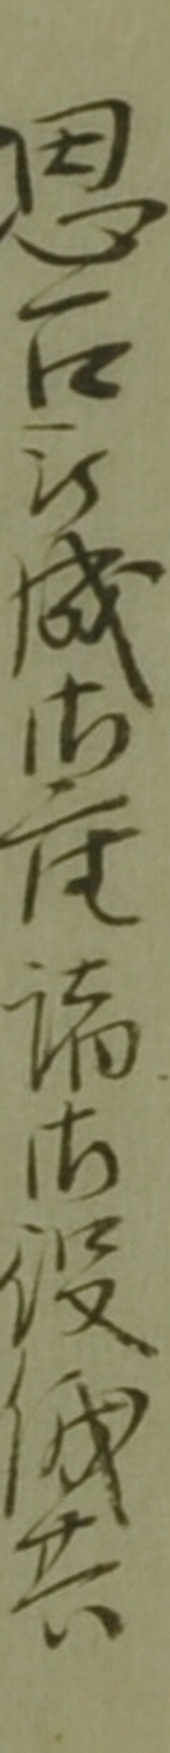思召被成御座諸御役儀共
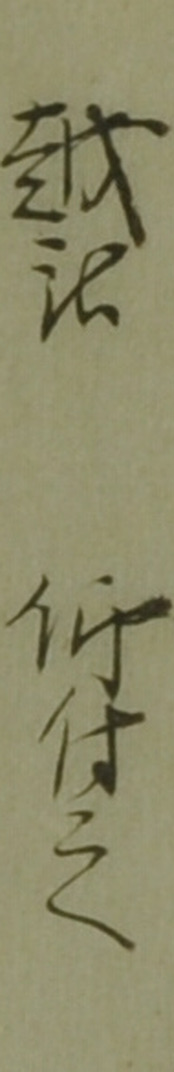越被仰付之
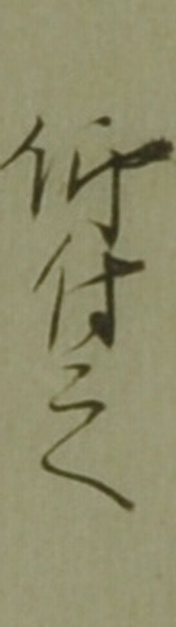仰付之
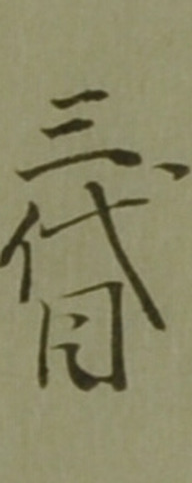三代目
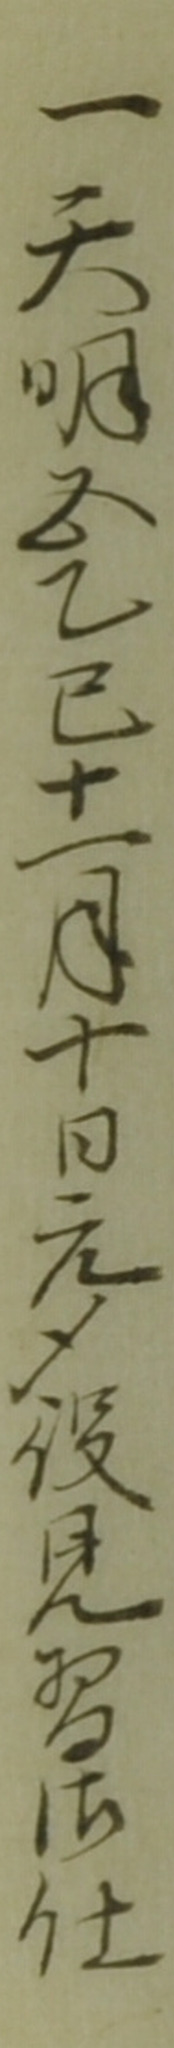一天明五乙巳十一月十日元〆役見習御仕
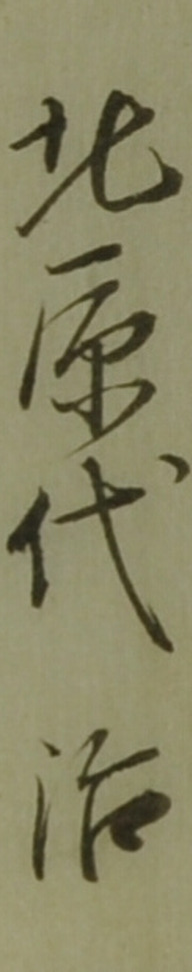北原代治

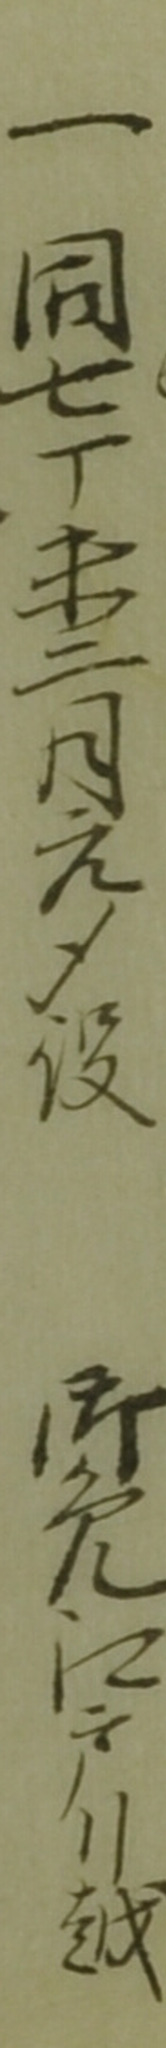一同七丁未二月元〆役御免江戸引越
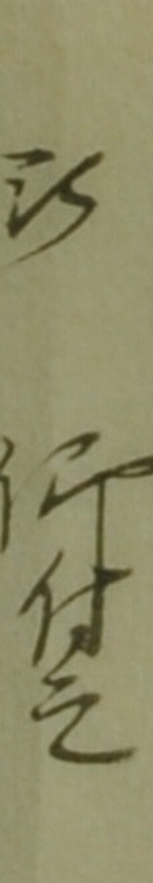被仰付之
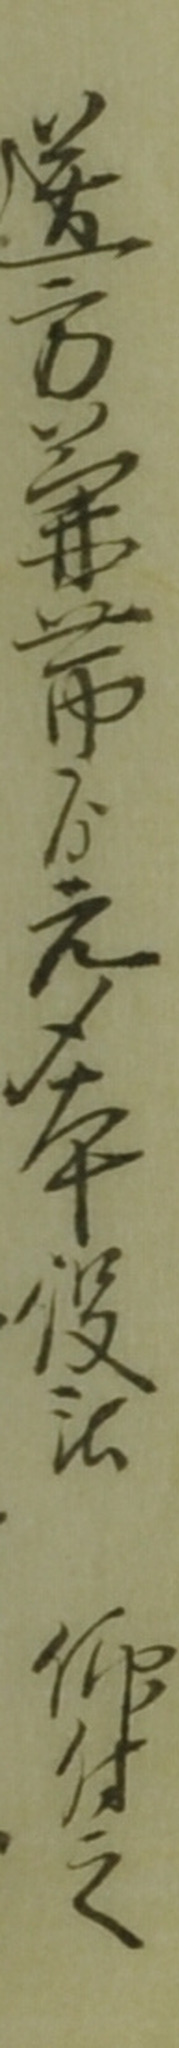送方兼帯ゟ元〆本役被仰付之
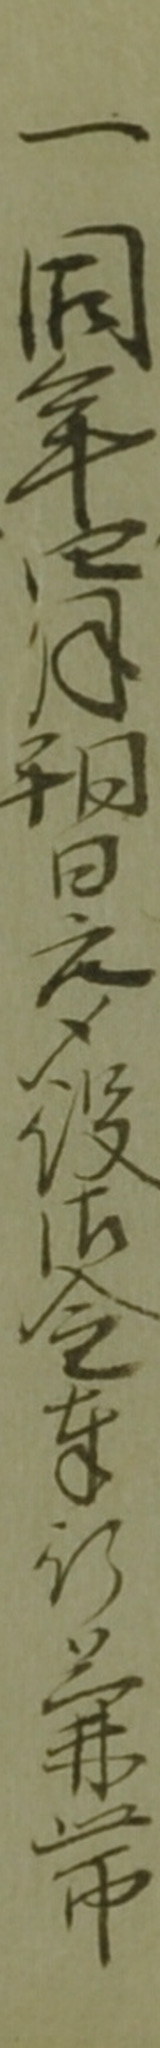一同年四月朔日元〆役御金奉行兼帯
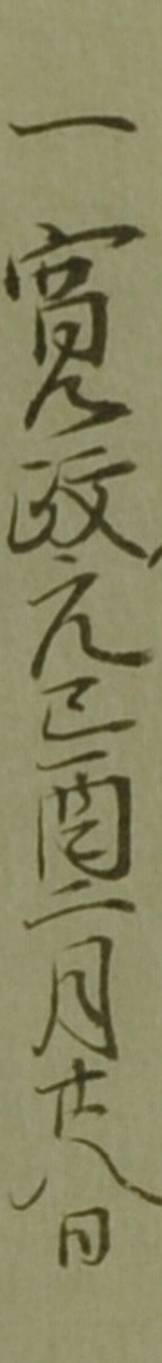一寛政元己酉二月廿八日
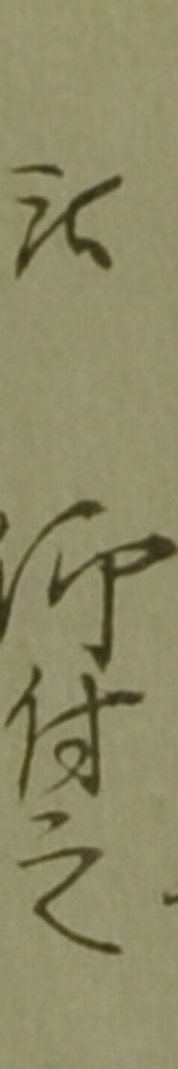被仰付之
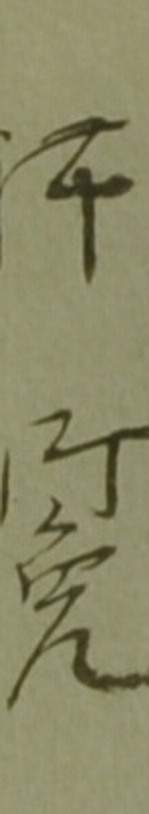滞御免
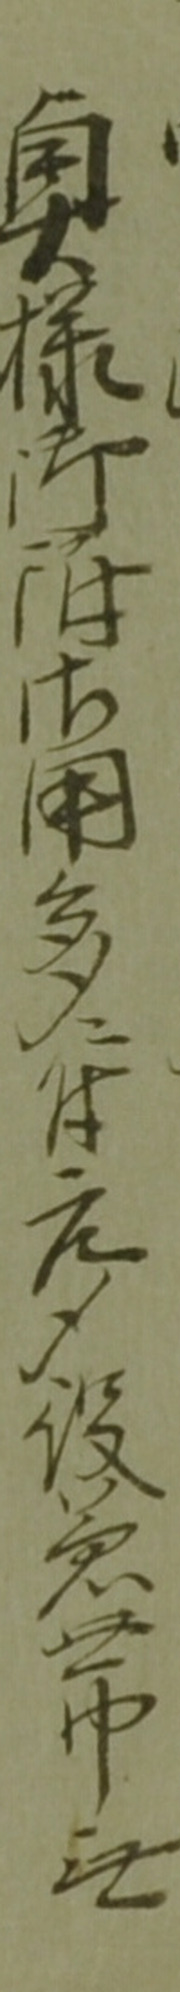奥様御附御用多付元〆役兼帯無
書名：諸御役代々録（七）
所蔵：伊那市立高遠町図書館・合同会社AMANE
